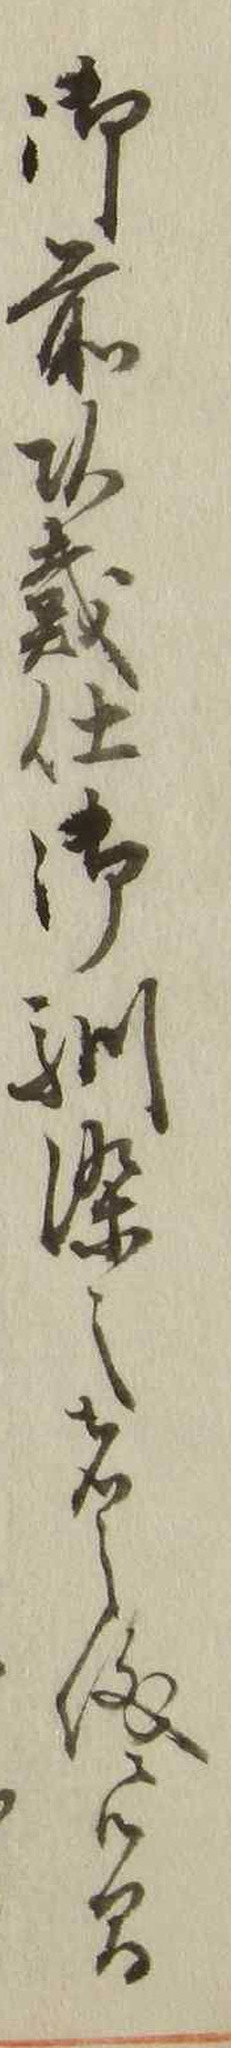御前頂戴仕御馴染之者之儀ニ候間
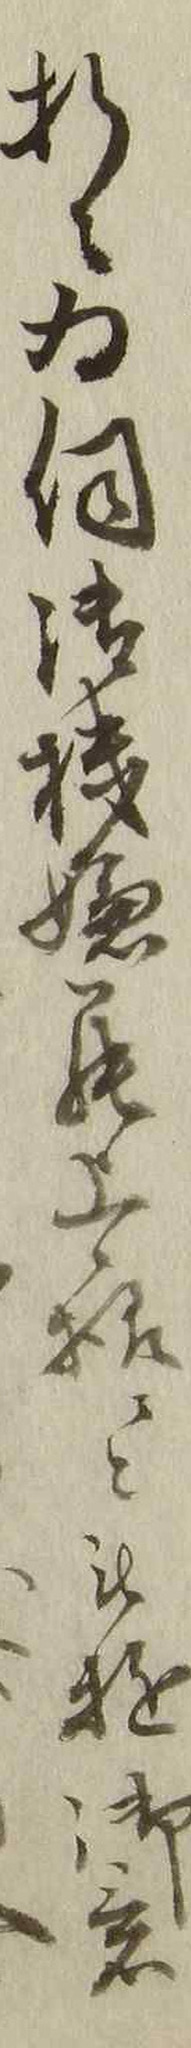折々為伺御機嫌罷上候様ニと被遊御意
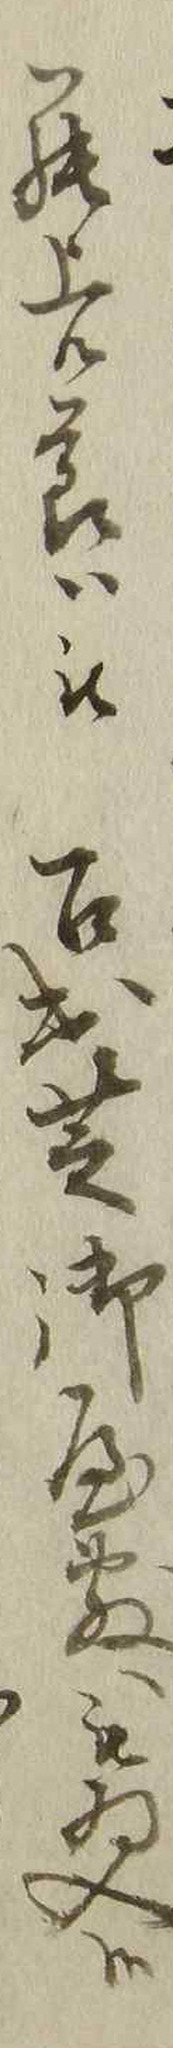罷上候節ハ被召出芝御屋敷へ被為入候
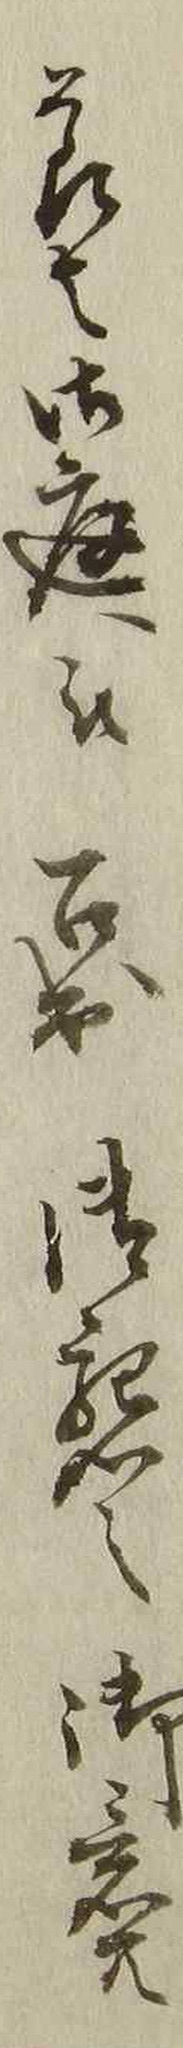節者御庭へ被召出御懇之御意共
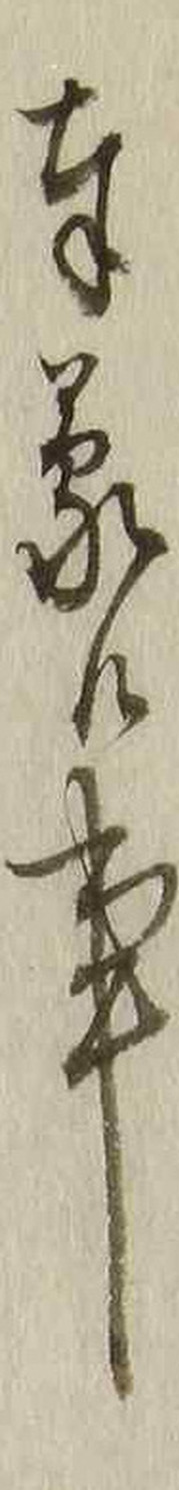奉蒙候事
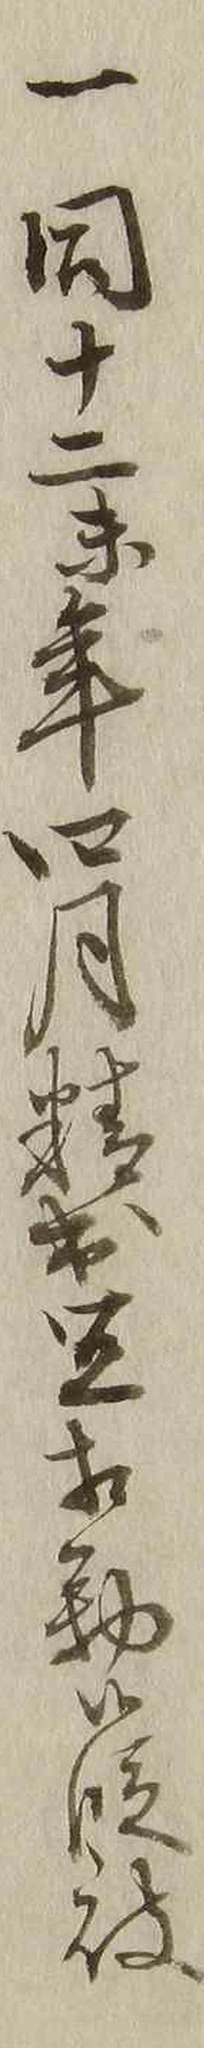一同十二未年四月精出宜相勤候段被
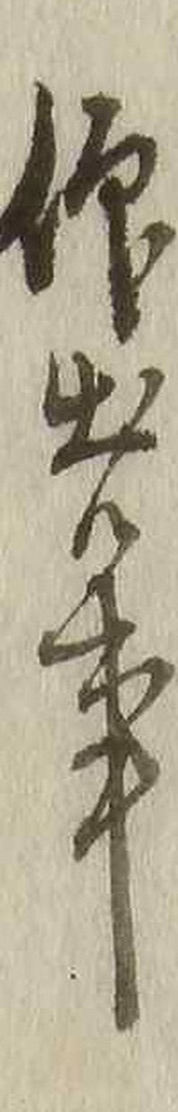仰出候事
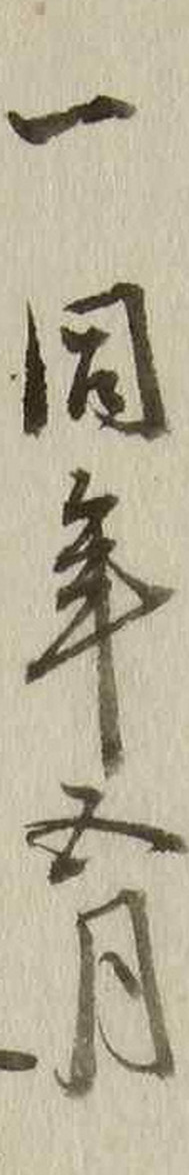一同年五月
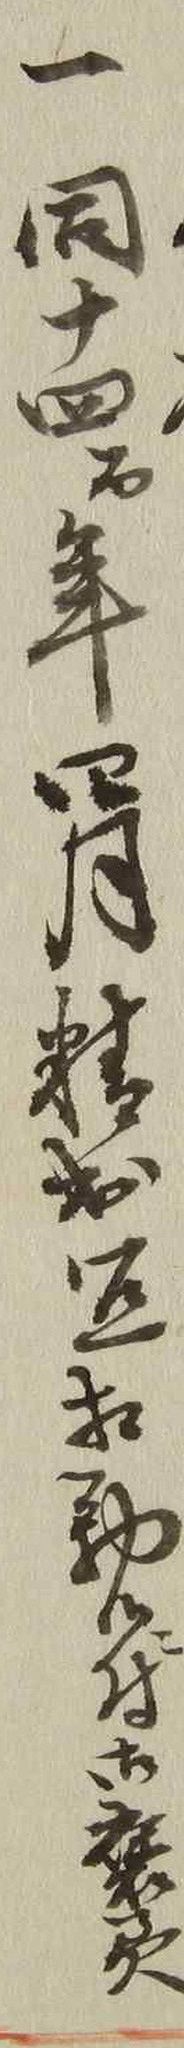一同十四酉年四月精出宜相勤候ニ付御褒美
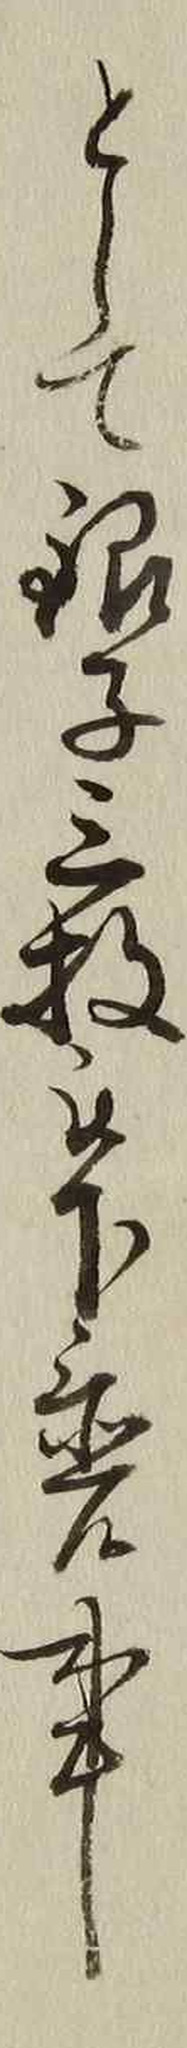として銀子三枚被下置候事
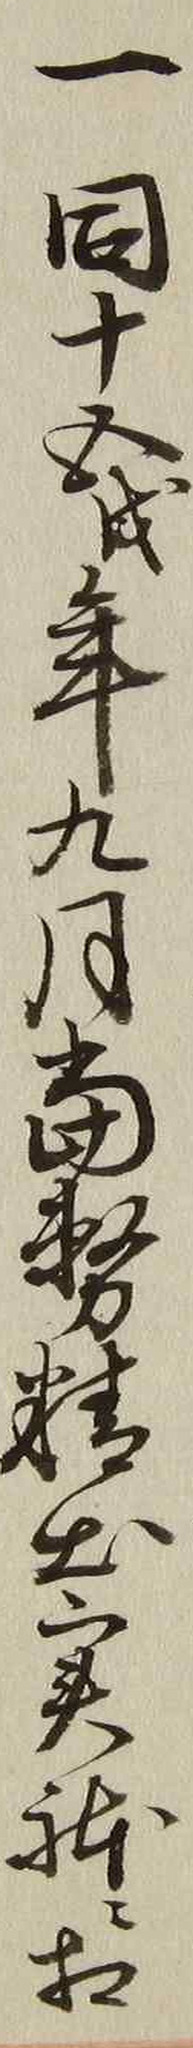一同十五戌年九月当務精出実体ニ相
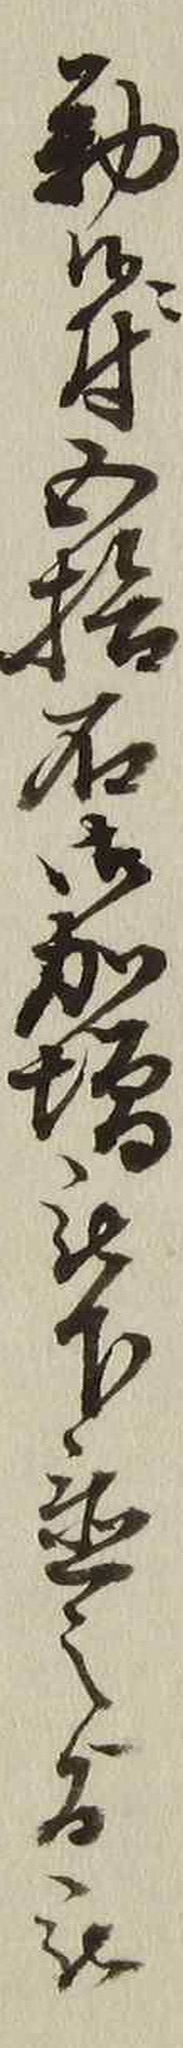勤候ニ付五拾石御加増被下置之旨被
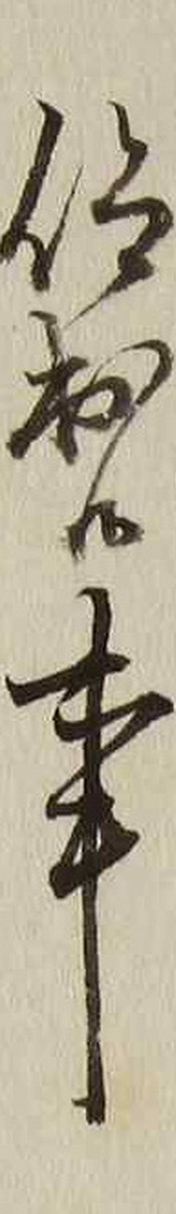仰出候事
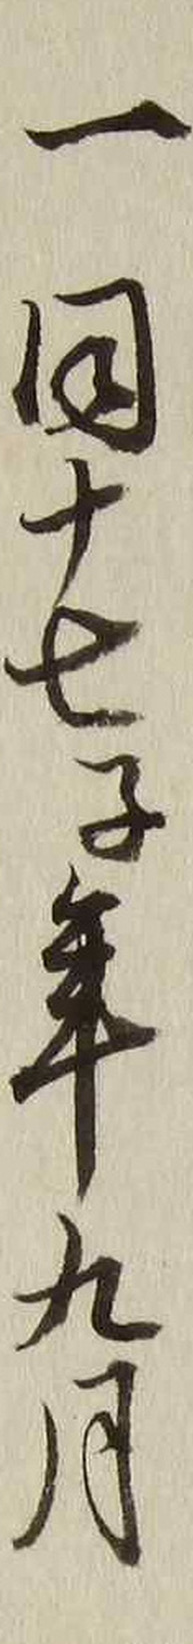一同十七子年九月
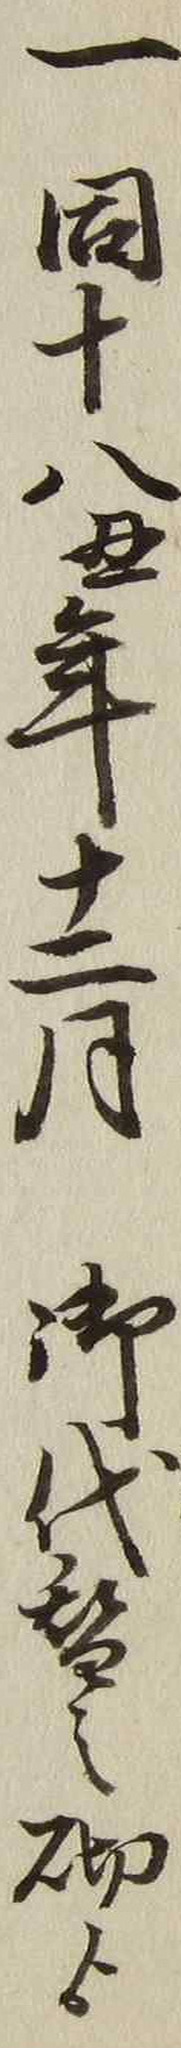一同十八丑年十二月御代替之砌ゟ
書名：諸士系譜　巻之23　い之部23
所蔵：会津若松市立会津図書館
